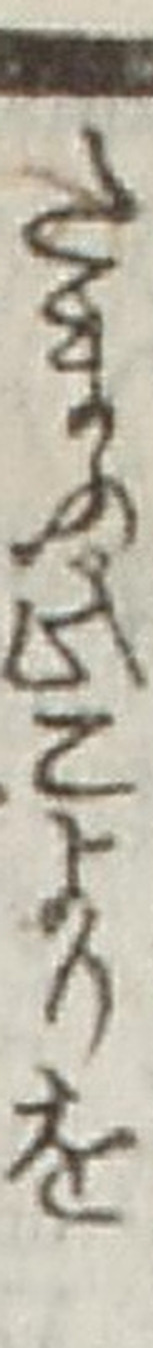たまふ此こよりを
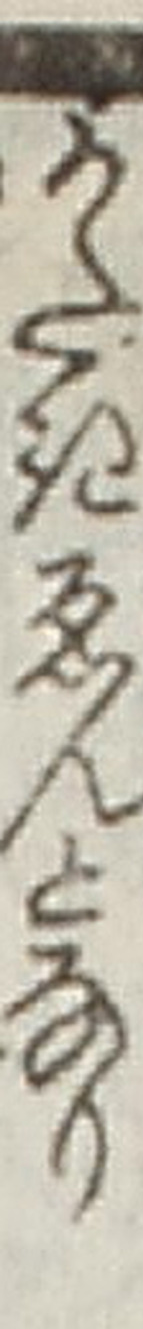かたきゑんとなり
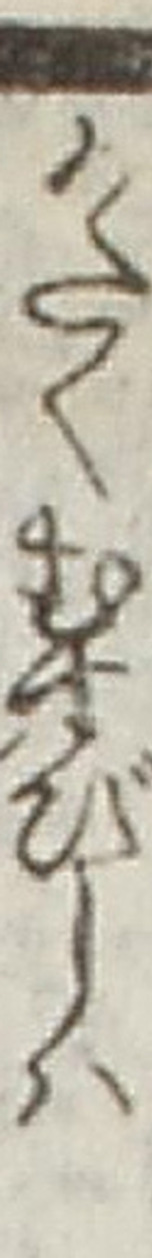かたくむすびしハ
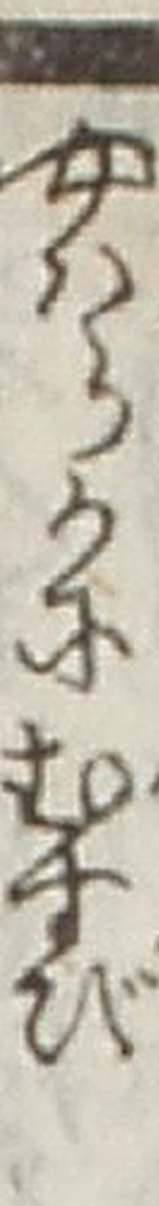やハらかにむすび
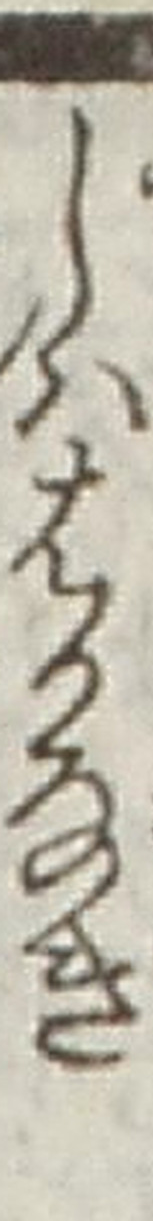しハはかなき
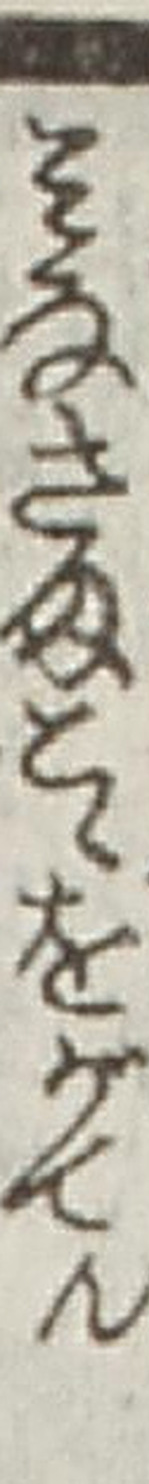ミなさまこゝをがてん
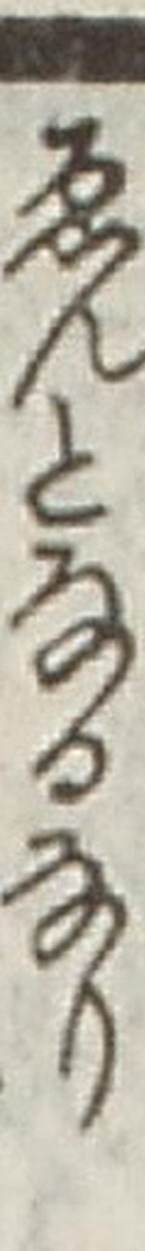ゑんとなるなり
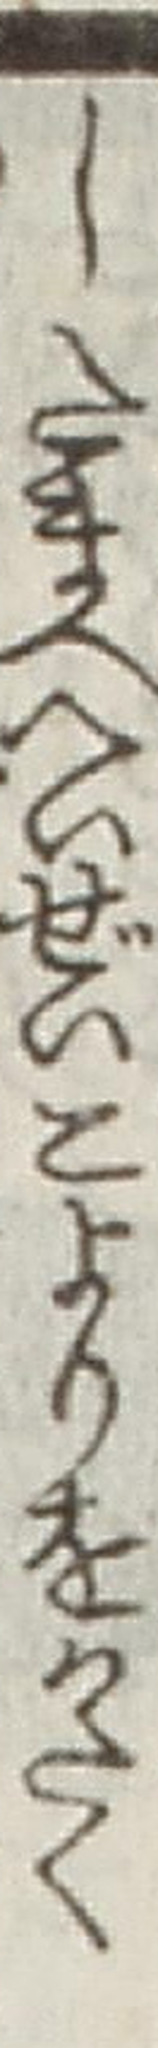したまへへいぜいこよりをかたく
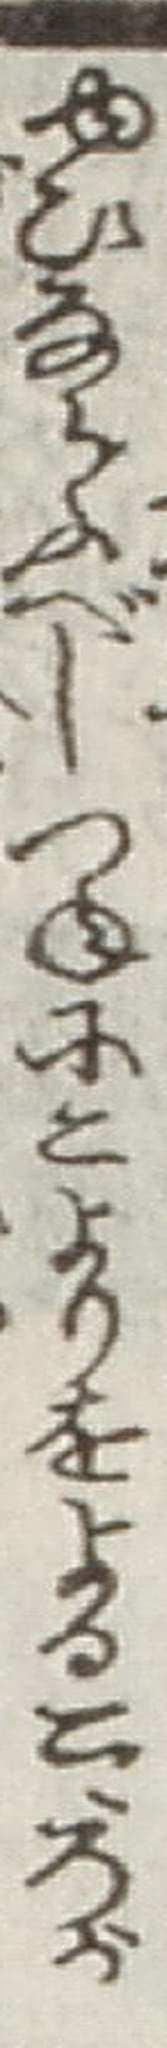ゆひならふべしつねにこよりをよるこゝろが
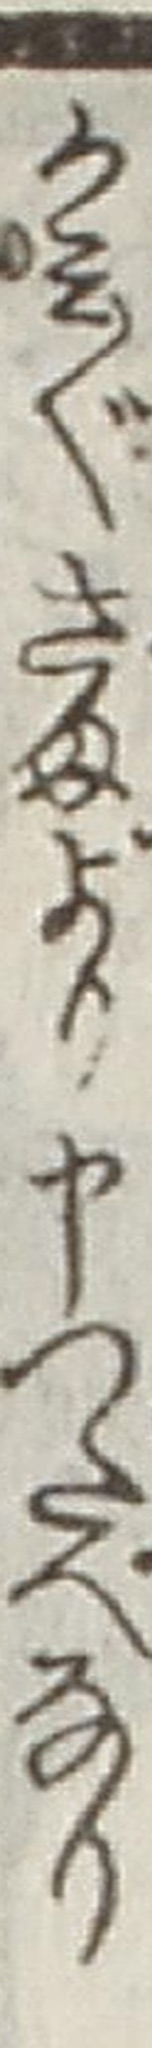かミ〴〵さまより申つたへなり
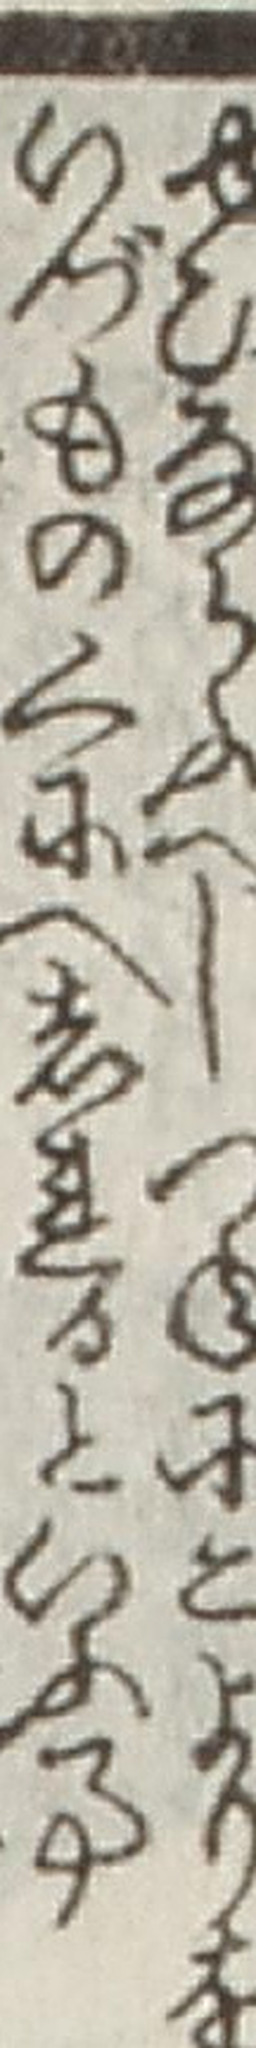いづものくにへしれるといふ事
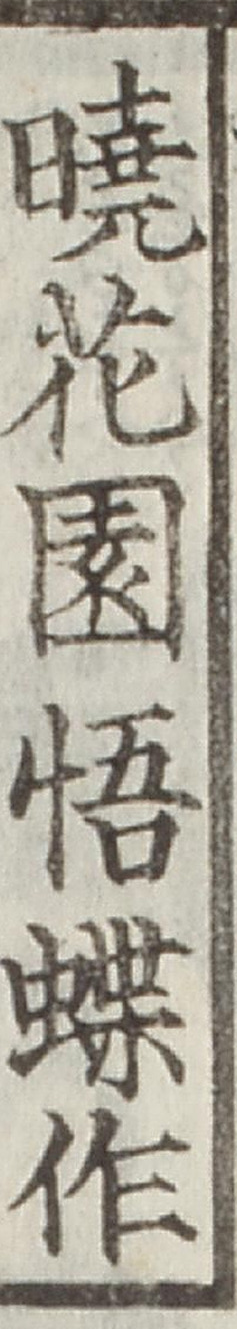曉花園悟蝶作
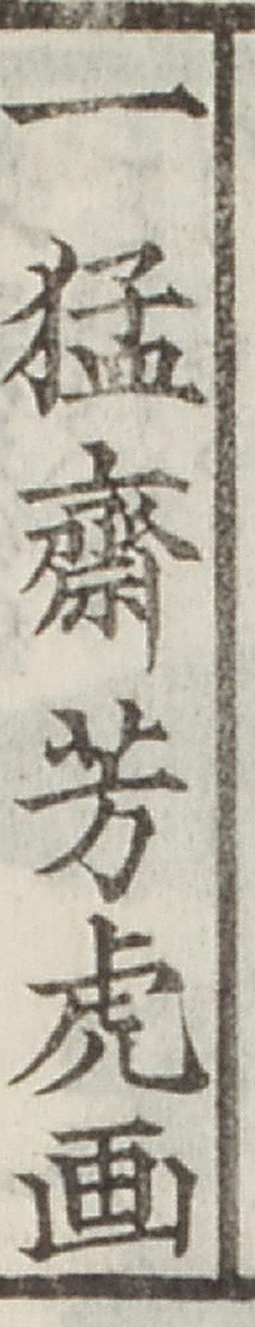一猛齋芳虎画
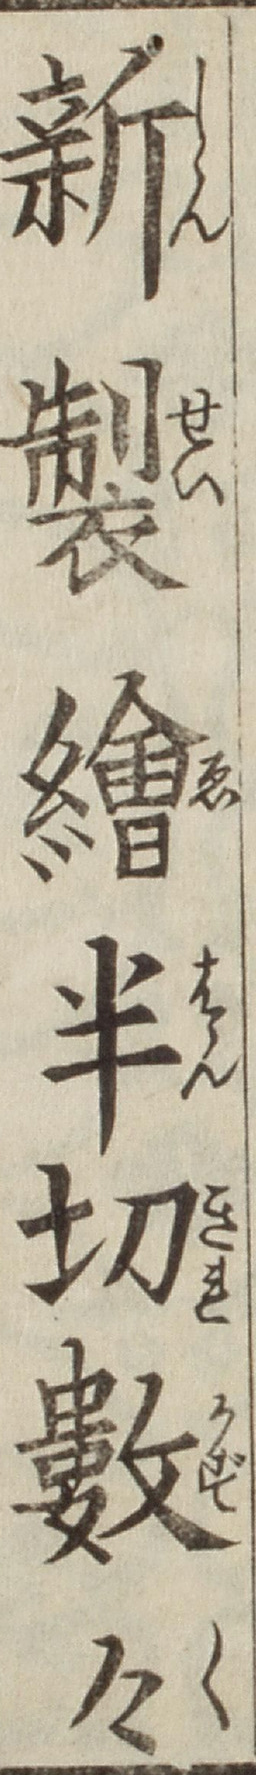新製絵半切数々
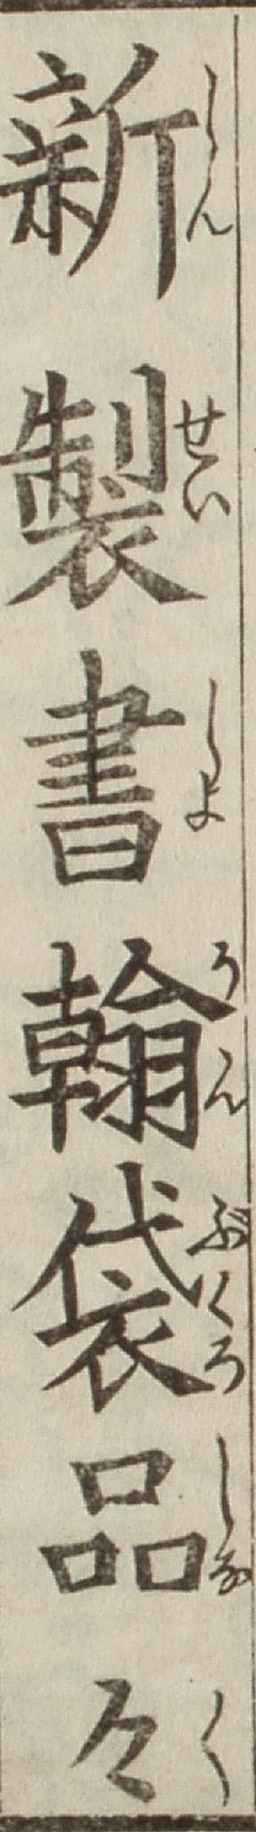新製書翰袋品々

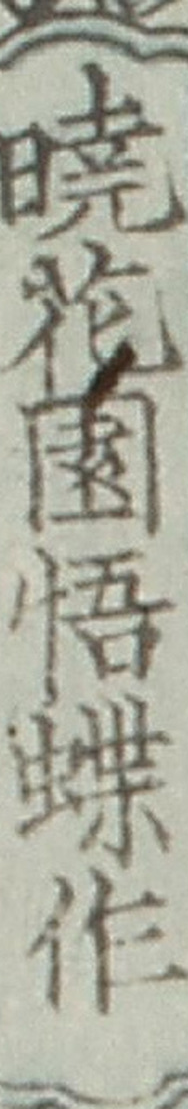暁花園悟蝶作
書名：三世相出雲當座帳　上下冊
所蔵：東京大学地震研究所図書室 Earthquake Research Institute Library, The University of Tokyo, JAPAN
